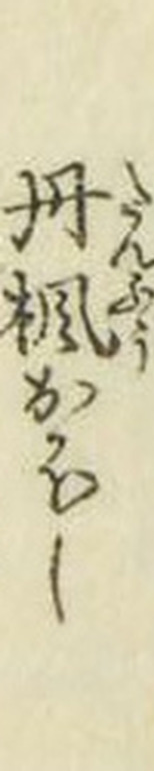丹楓おほし
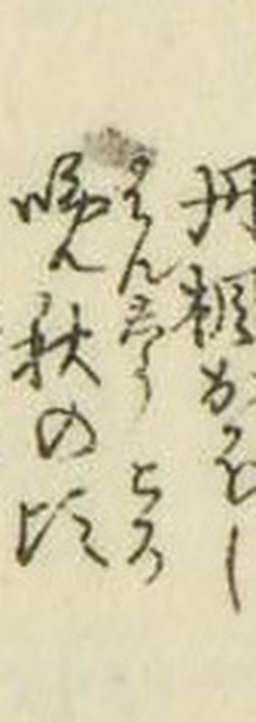晩秋の頃
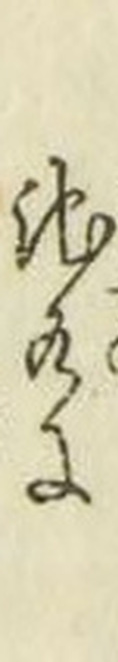池水に
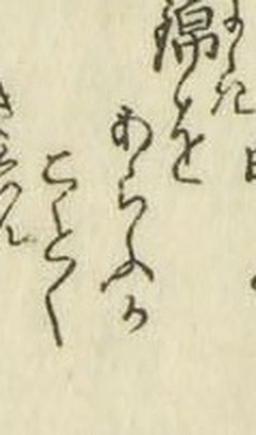あらふか
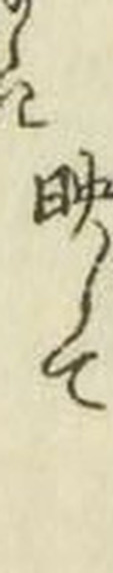映して
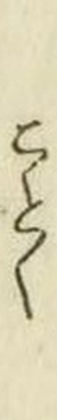ことし

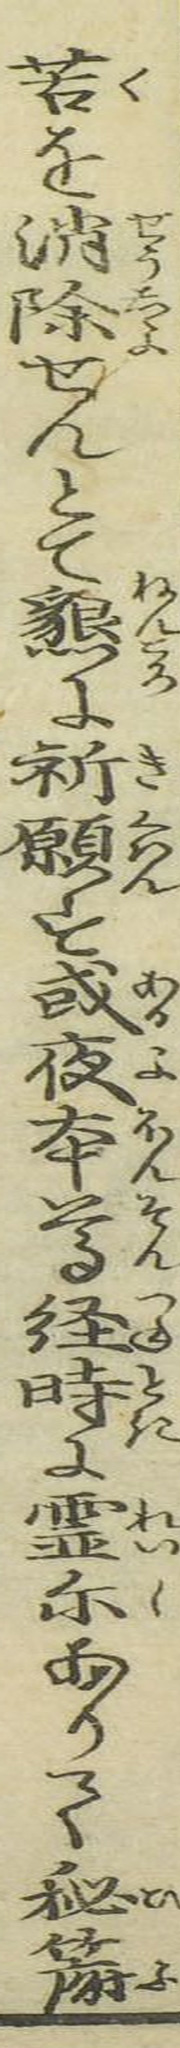苦を消除せんとて懇に祈願す或夜本尊経時に霊示ありて秘符
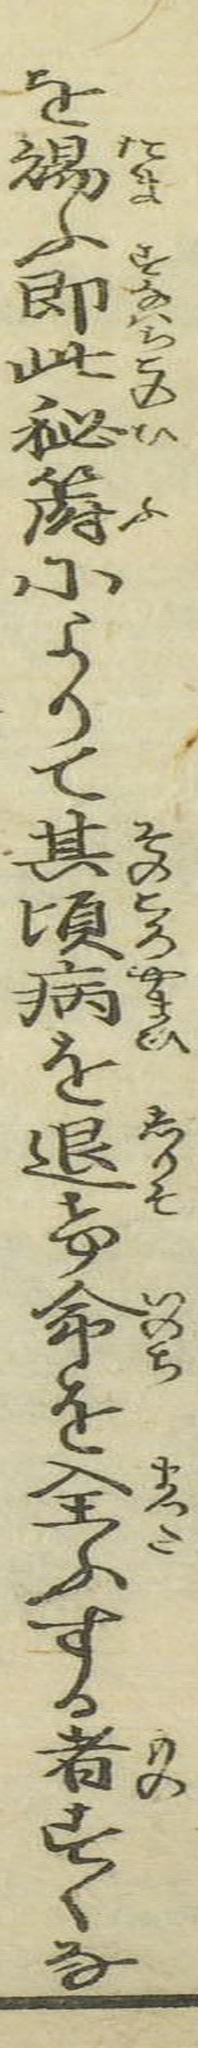を賜ふ即此秘符によりて其頃病を退け命を全ふする者すくな
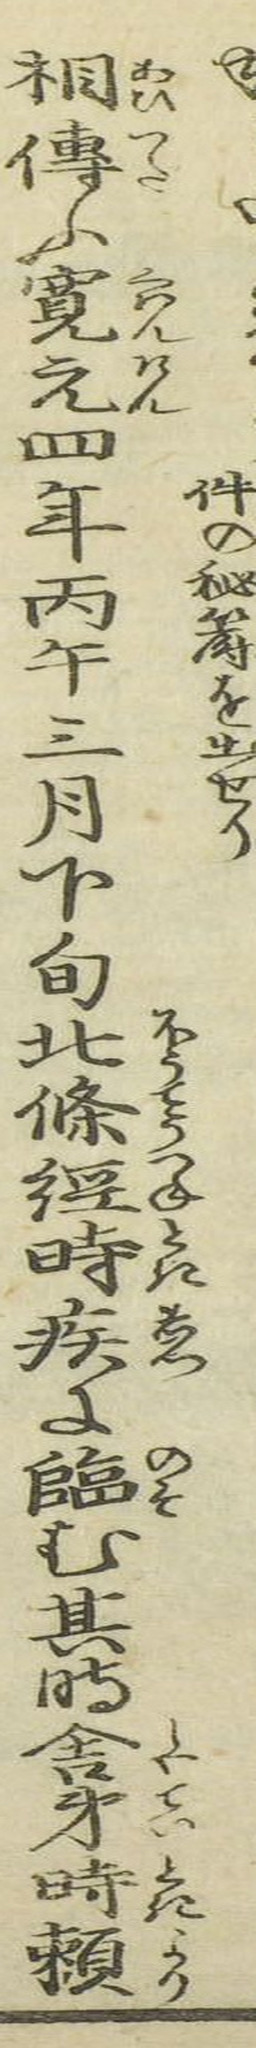相伝ふ寛元四年丙午三月下旬北条経時疾に臨む其時舎弟時頼
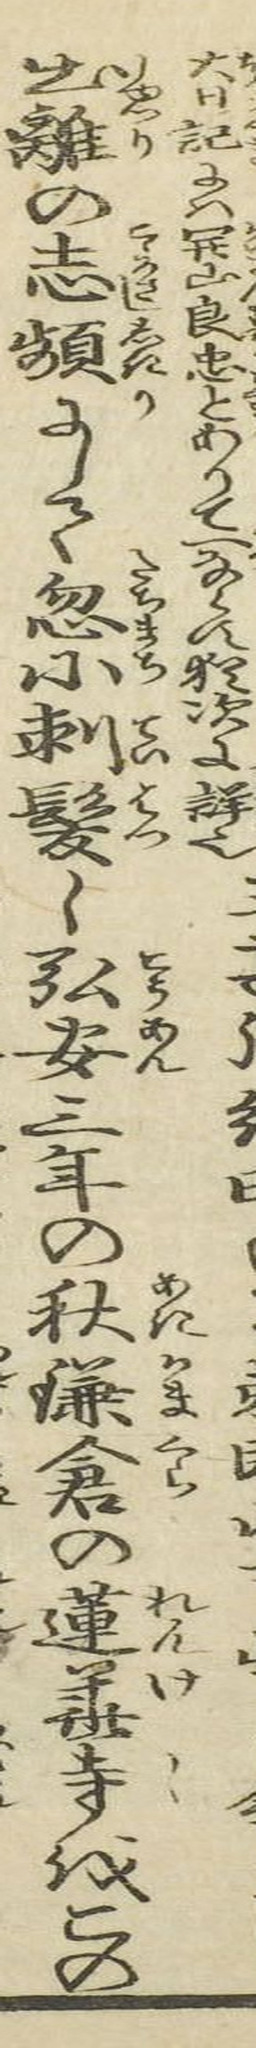出離の志頻にして忽に剃髪し弘安三年の秋鎌倉の蓮華寺をこの
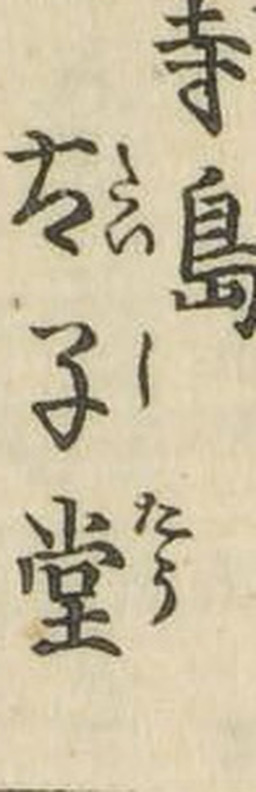太子堂
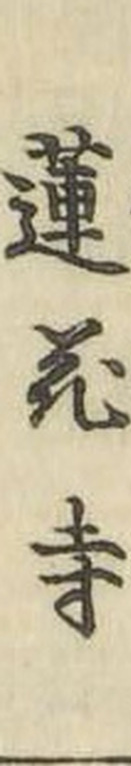蓮華寺

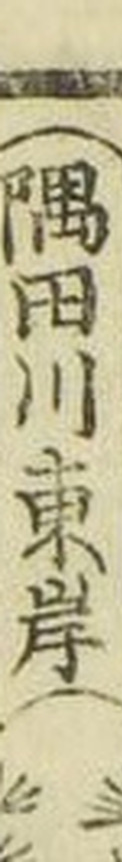隅田川東岸

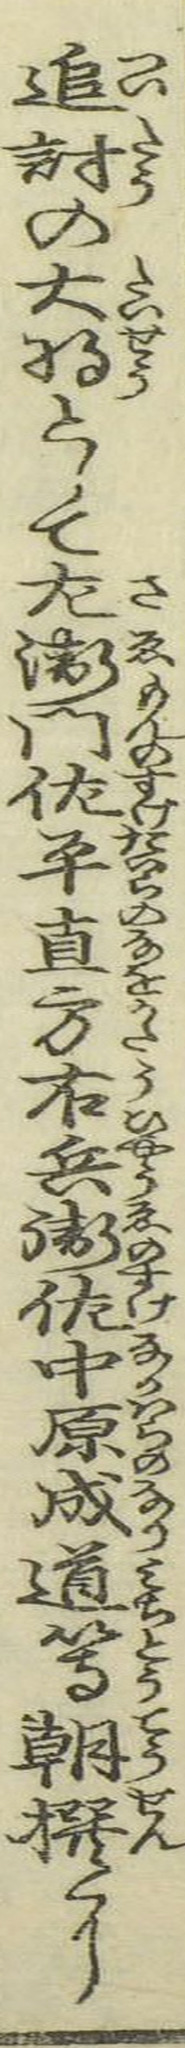追討の大将として左衛門佐平直方右兵衛佐中原成道等朝撰に
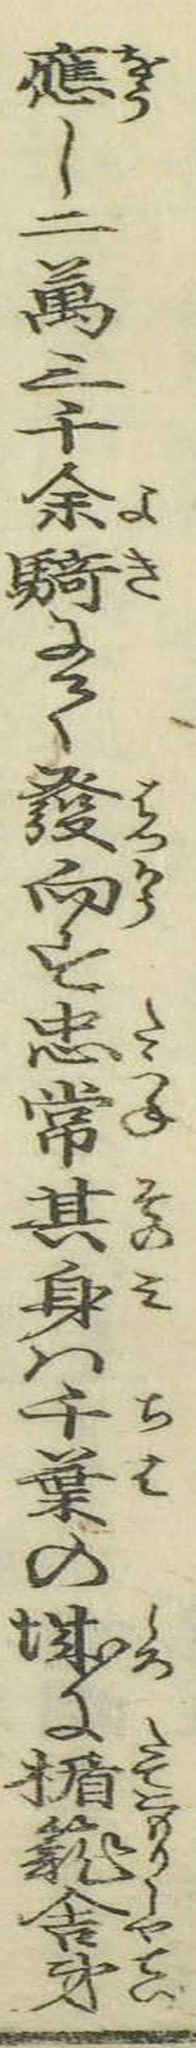応し二万三千余騎にて発向す忠常其身は千葉の城に楯篭舎弟
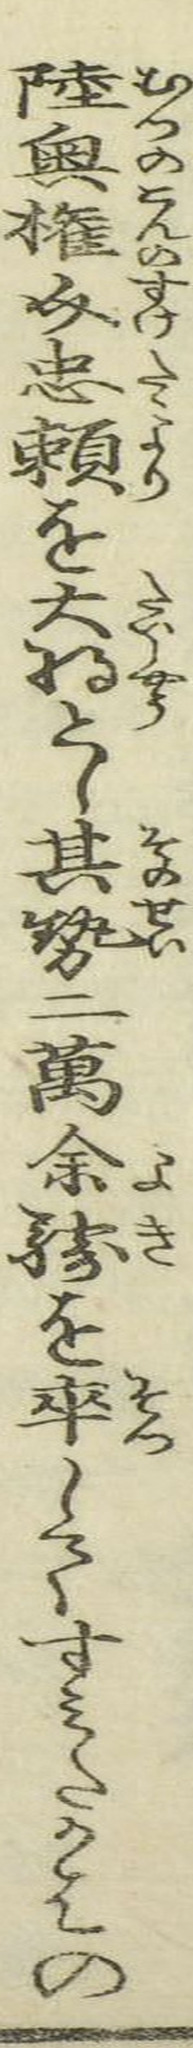陸奥権介忠頼を大将とし其勢二万余騎を卒してすみたかはの
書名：江戸名所図会 20巻 巻之19
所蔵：東京学芸大学教育コンテンツアーカイブ
